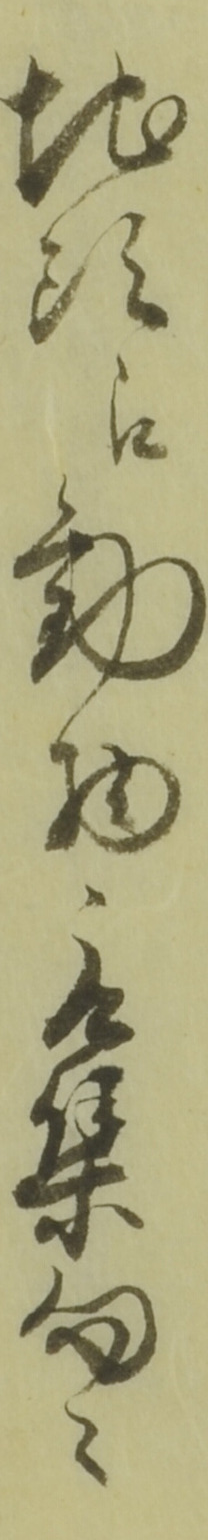地頭江勧物取集向々
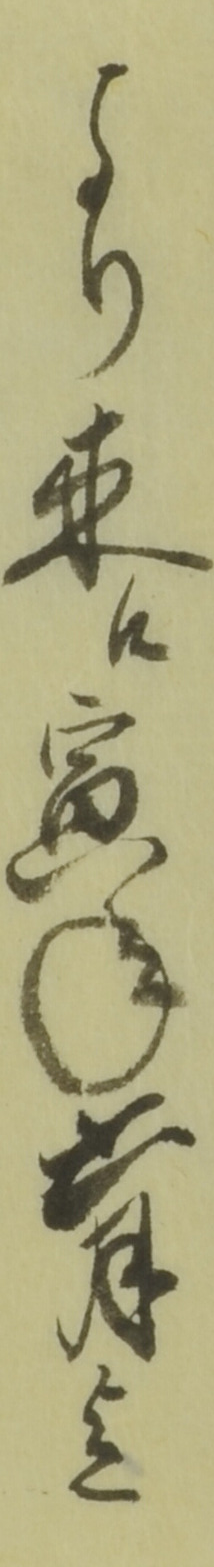より来ル寅年六月迄
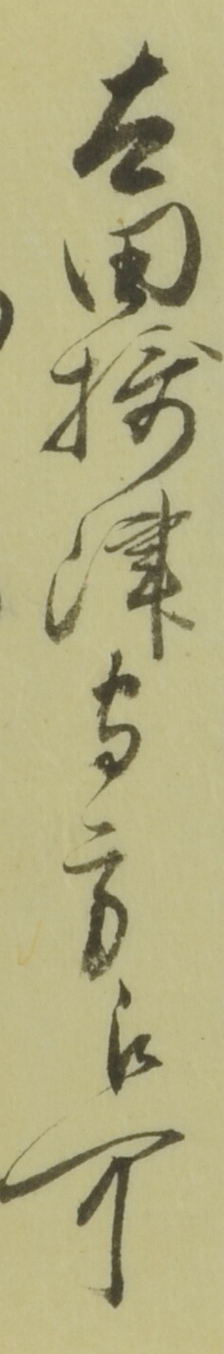太田摂津守方江可
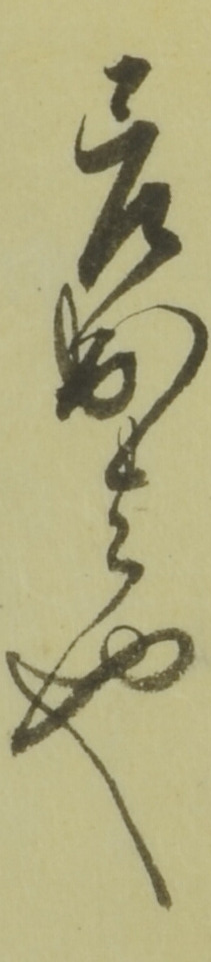差出者也
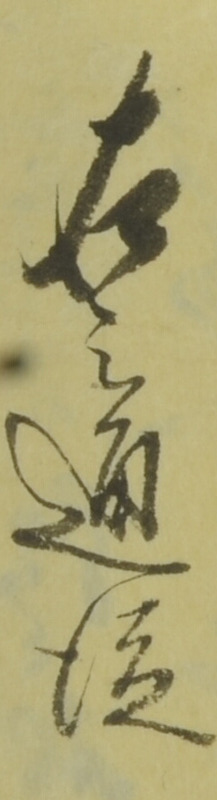右之通従
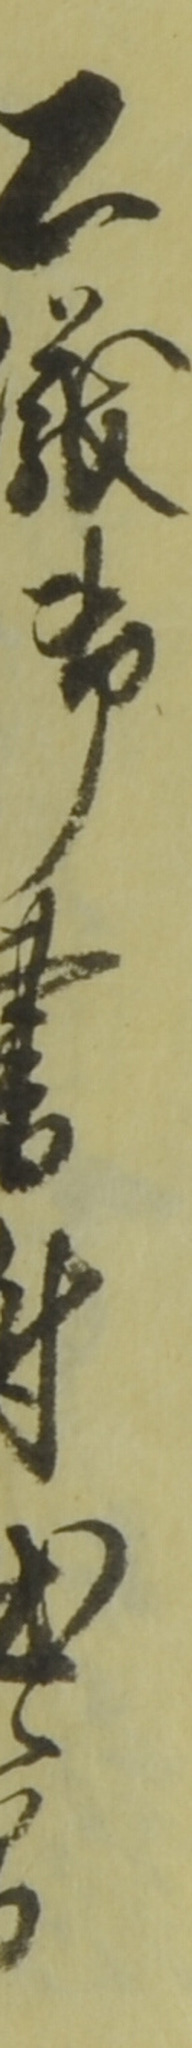公儀御書付出候間

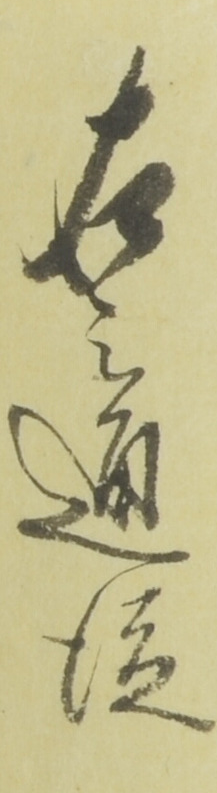右之通従
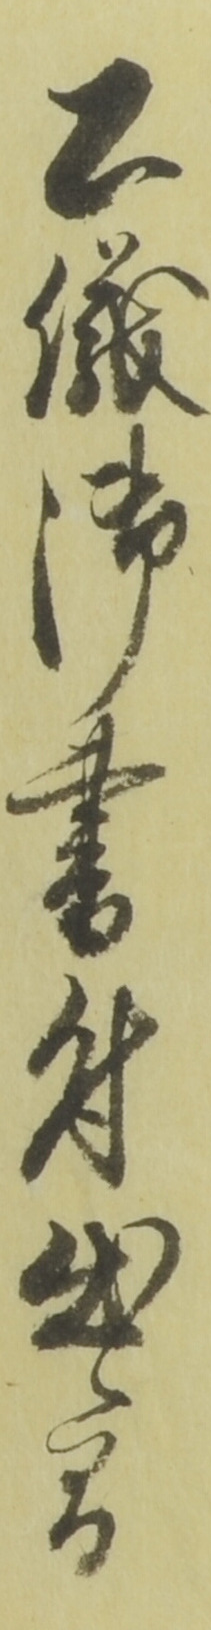公儀御書付出候間
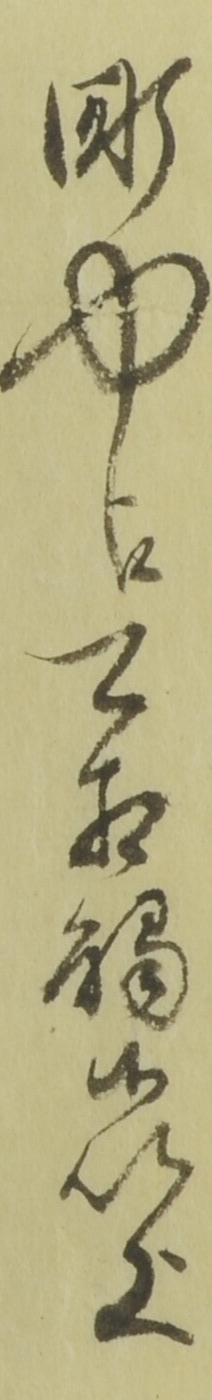町中江可相触候以上
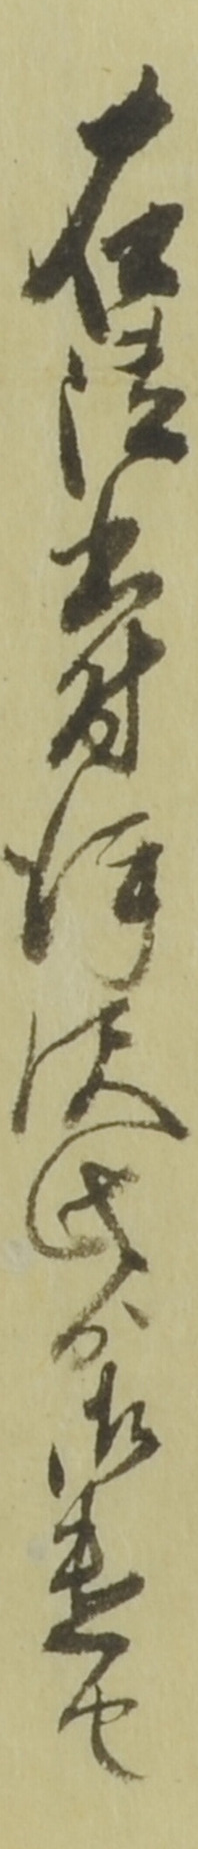右御書付伊沢氏ゟ御遣申
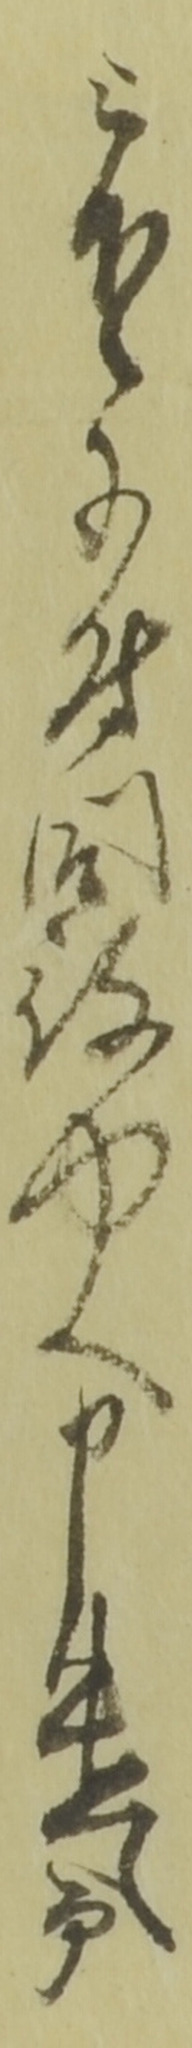被下候に付同役中へ申遣候而
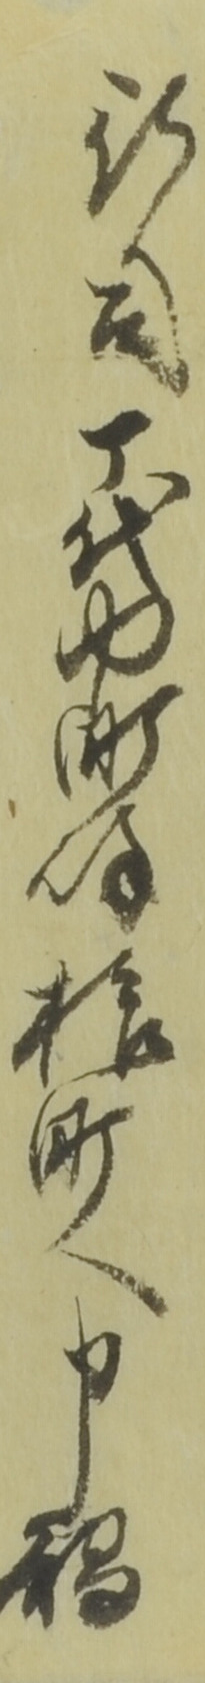行司丁代中町呼拾町へ申触
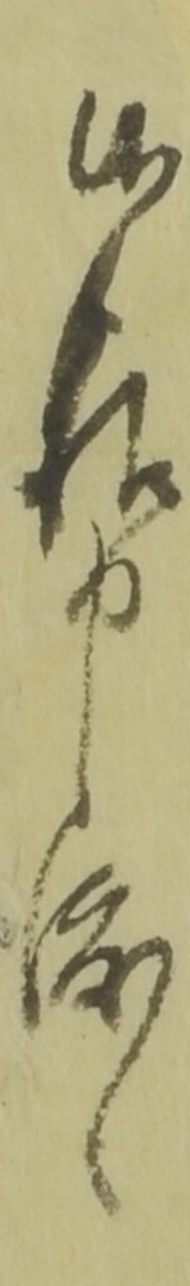候様申渡候
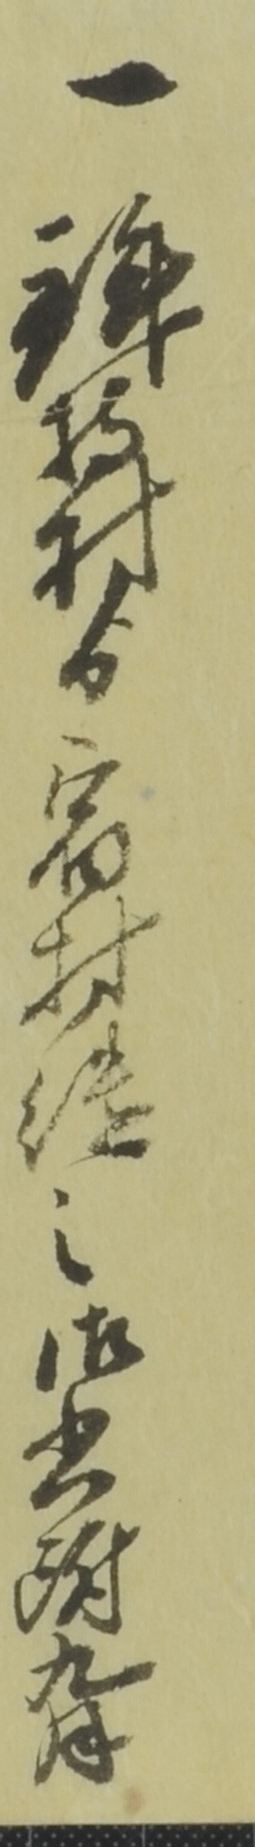一鉾持村ゟ宿村継之御書附九月
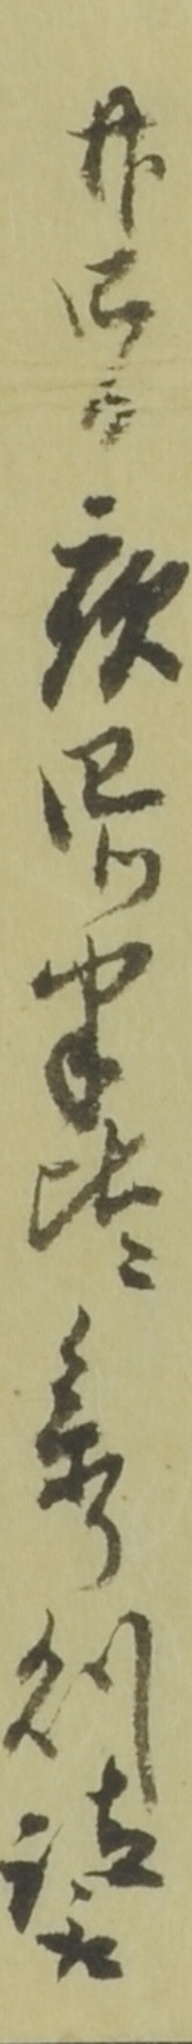廿四日夜四ツ半比ニ参り則請取
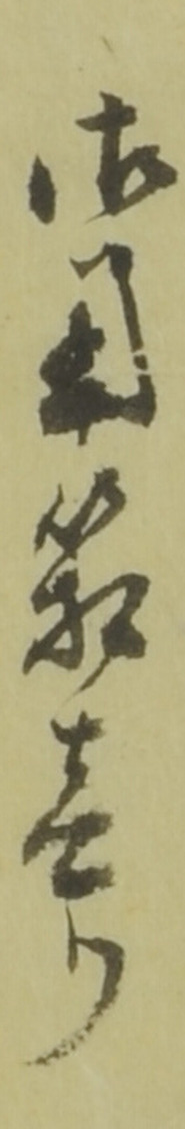御用箱壱ツ
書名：御触書御書附控
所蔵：伊那市立高遠町図書館・合同会社AMANE
